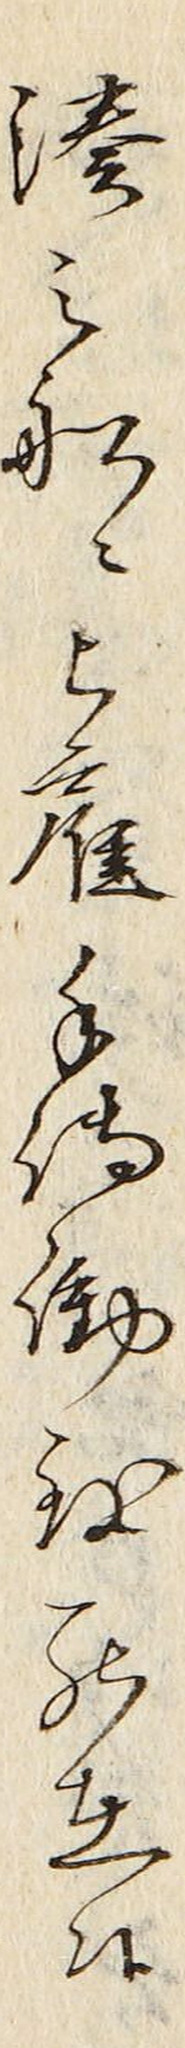湊之船に被雇手伝働致罷在候
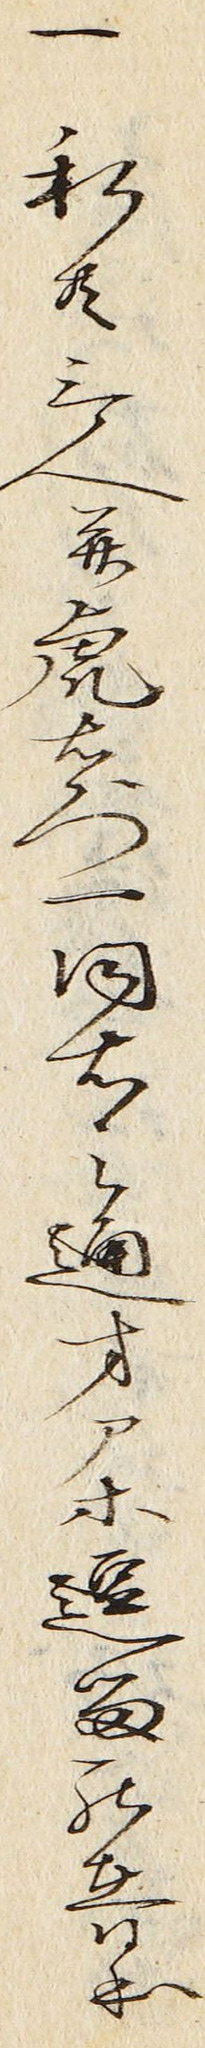一私共三人并虎右衛門一同右之通オアホ逗留罷在日本
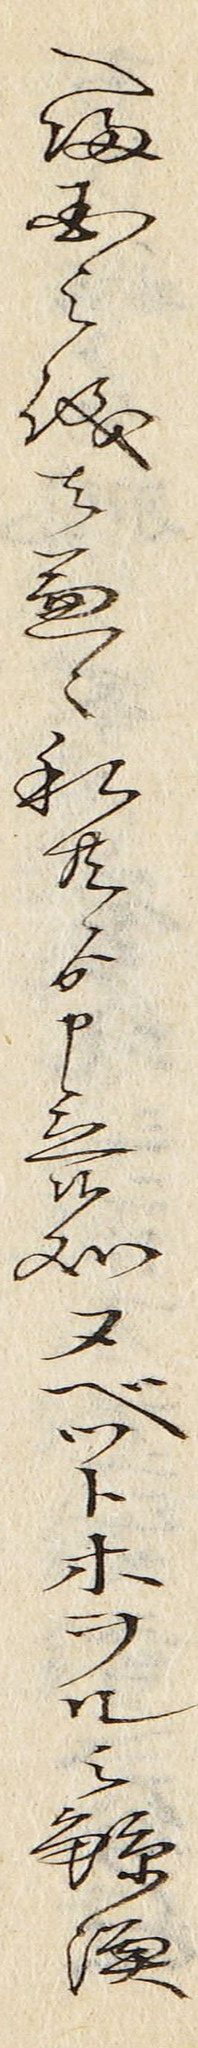へ帰国之儀は兼々私共ゟ申立候処ヌベツトホヲル之鯨漁
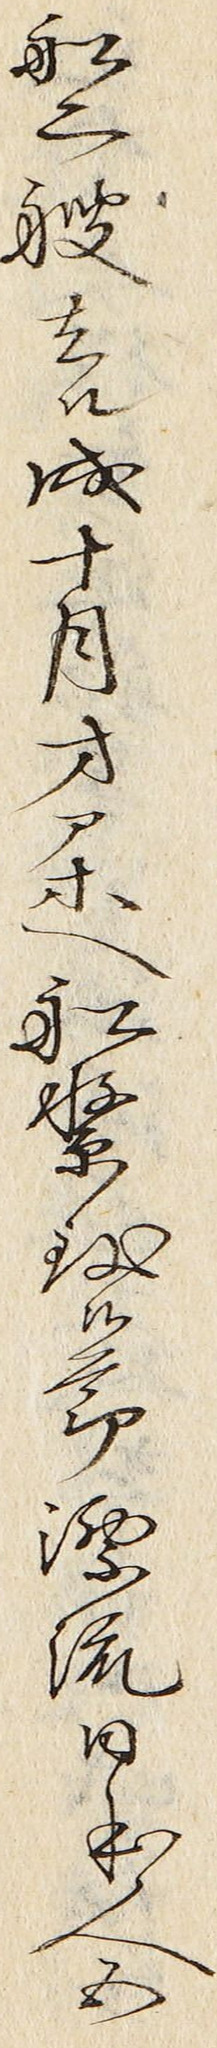船二艘去る戌十月オアホへ船繋致候節漂流日本人五
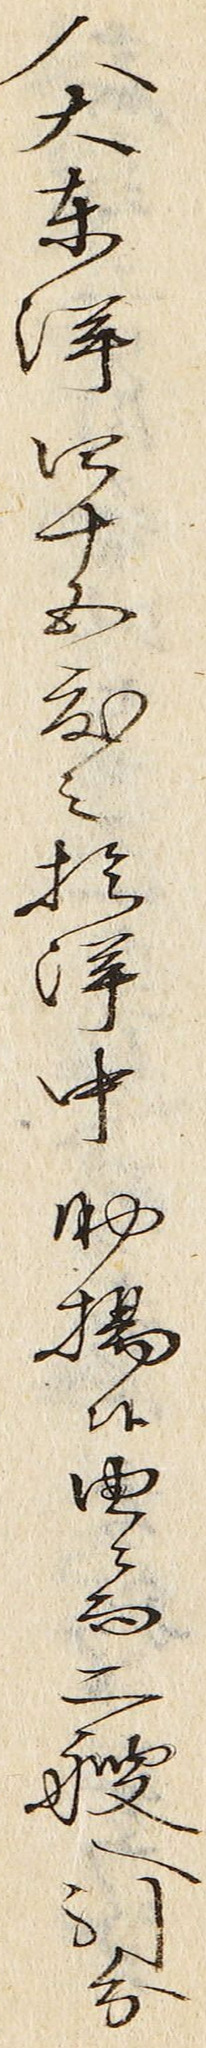人大東洋四十五度之於洋中助揚候由に而二艘へ引分
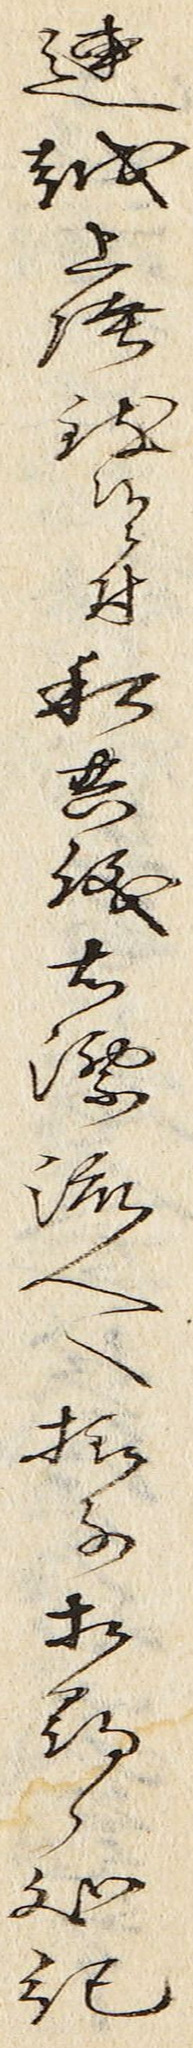連越上陸致候に付私共儀右漂流人へ様子相尋候処紀
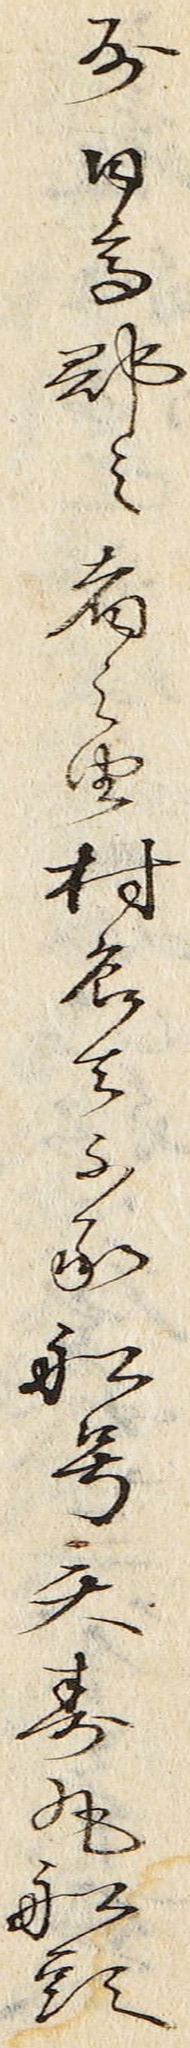州日高郡之者之由村名は不承船号は矢寿丸船頭
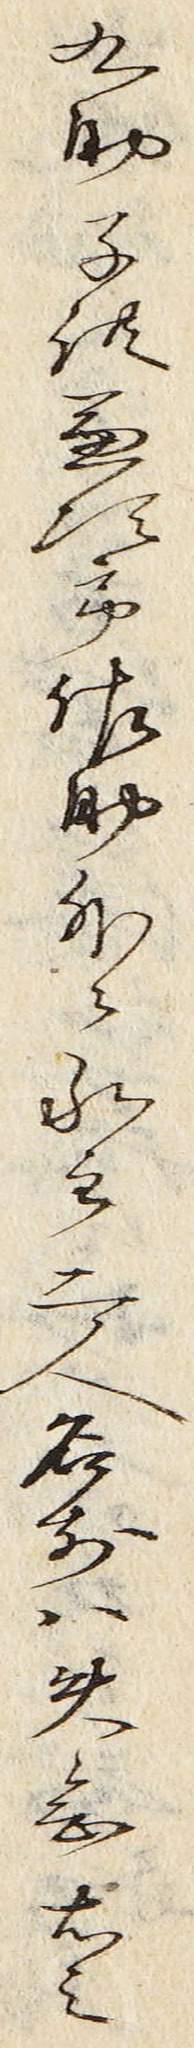丸助子供兼次郎佐助外に水主二人名前は失念右は
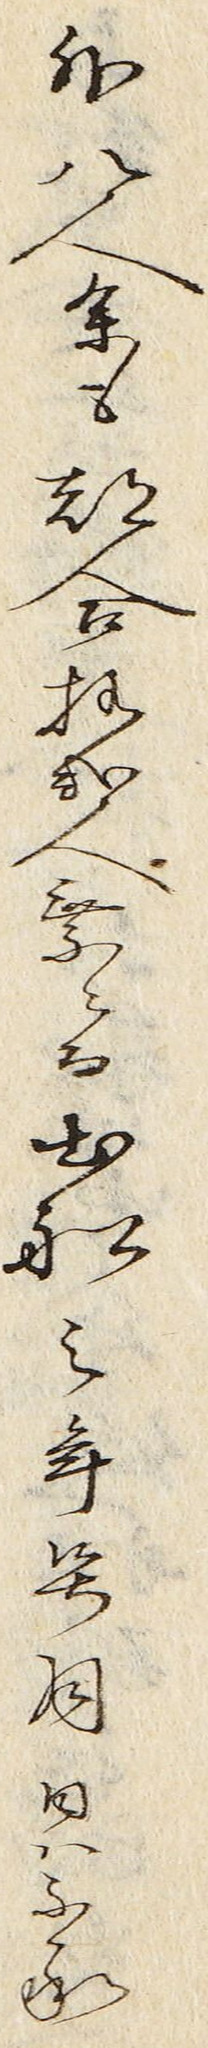外八人余も都合拾弐人乗に而出船之年号月日は不承
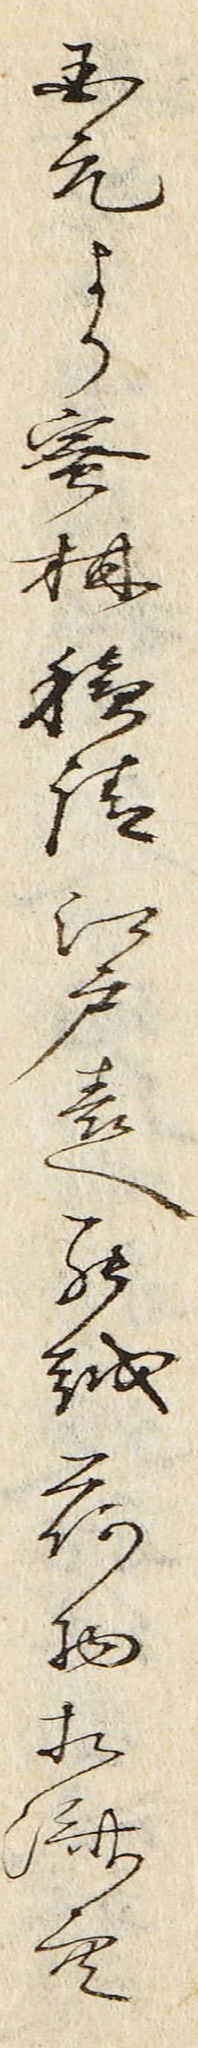国元より蜜林積請江戸表へ罷越荷物相済空
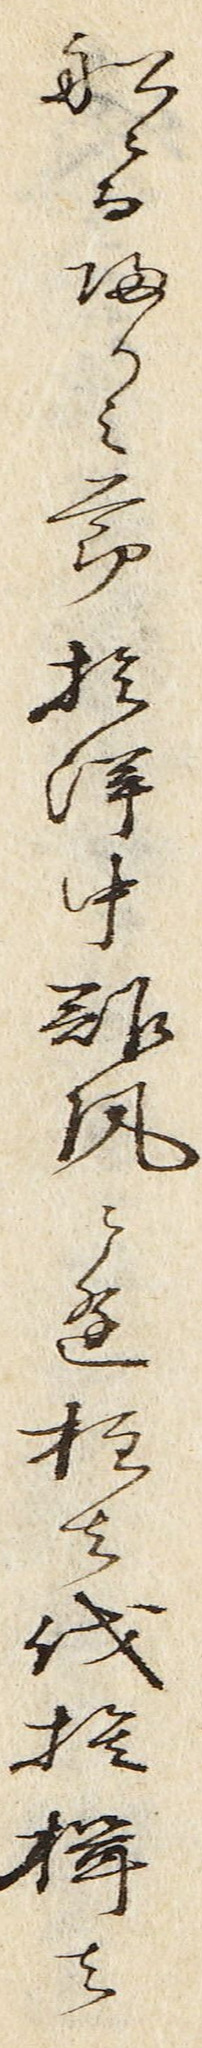船に而帰り之節於洋中難風に逢柱は伐捨楫は
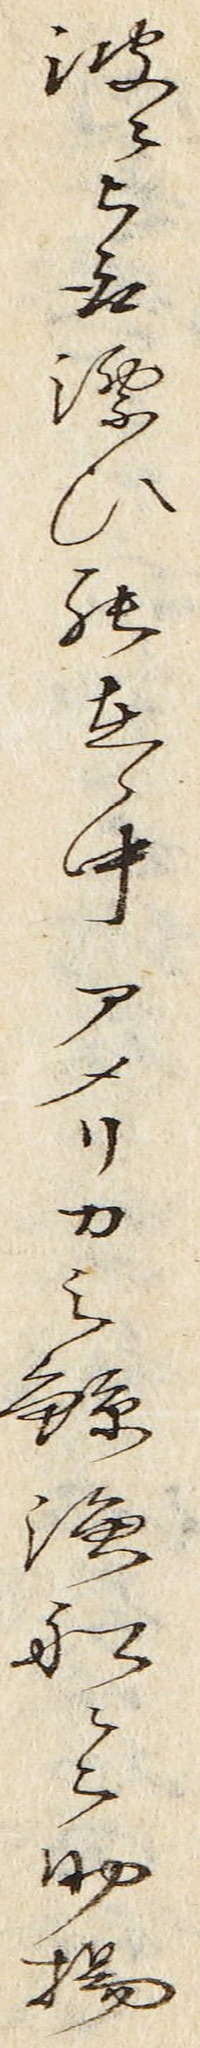波に被取漂ひ罷在候中アメリカ之鯨漁船に被助揚
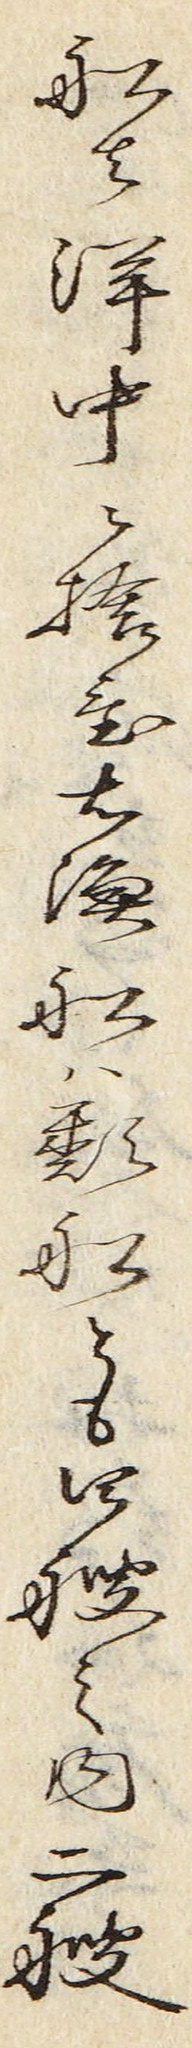船は洋中に捨置右漁船は類船とも四艘之内二艘
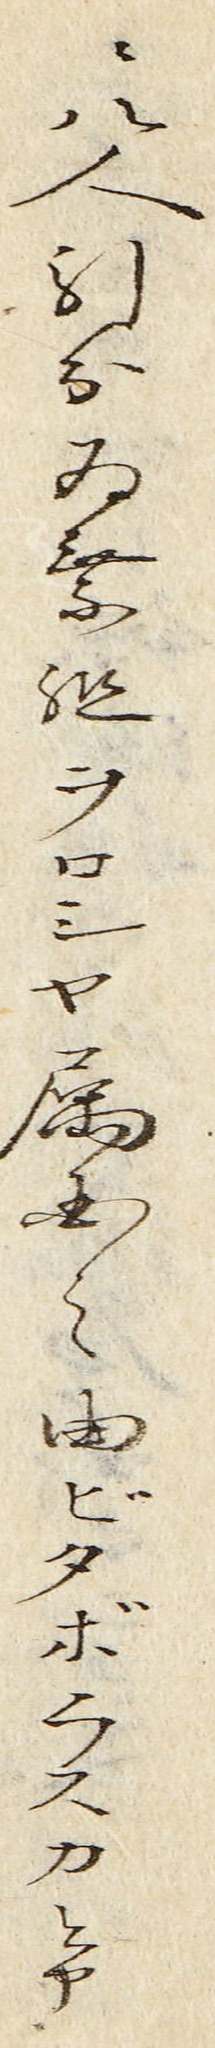に八人引分為乗組ヲロシヤ属国之由ビタボラスカと申
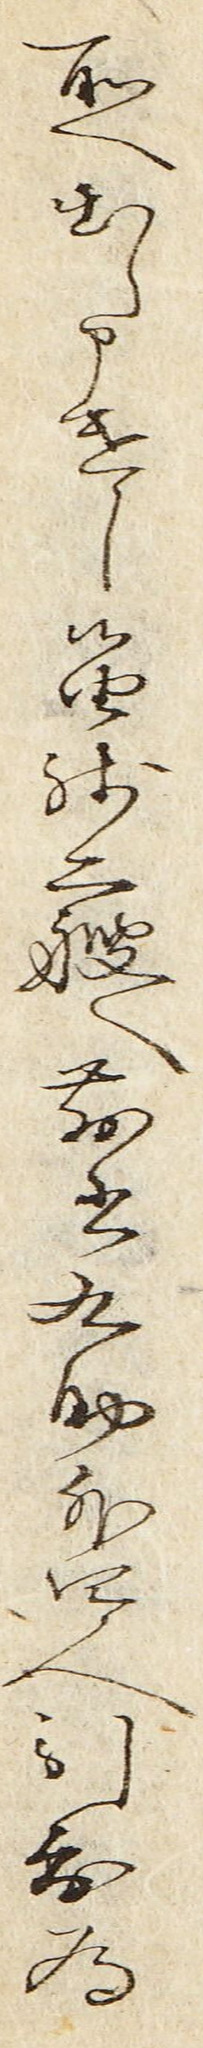所へ出し申遣し候由残二艘へ前書九助外四人引分為

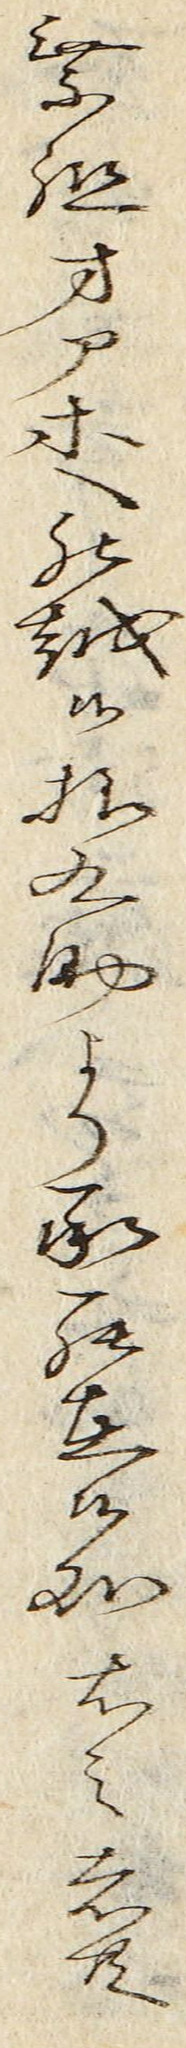乗組オアホへ罷越候様九助より承罷在候処右之者共
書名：土佐中浜万次郎漂流記
